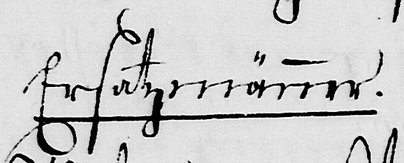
Ersatzmänner.
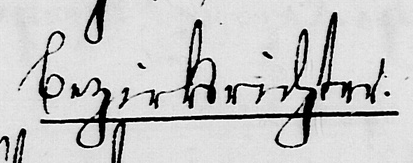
Bezirksrichter.
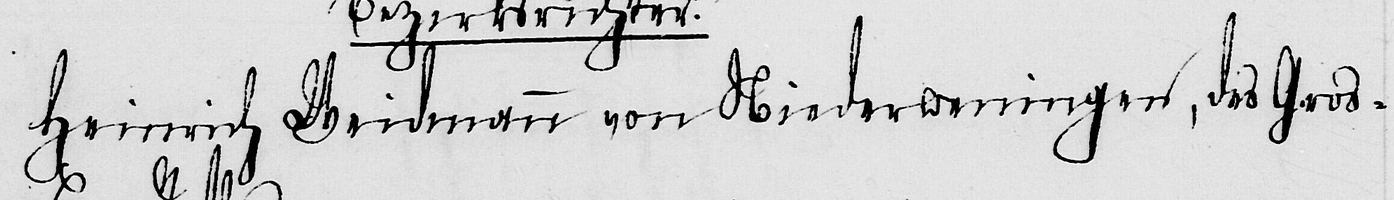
Heinrich Weidmann von Niederweningen, des Groß¬
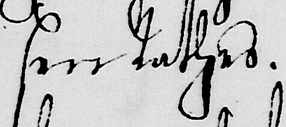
en Rathes.
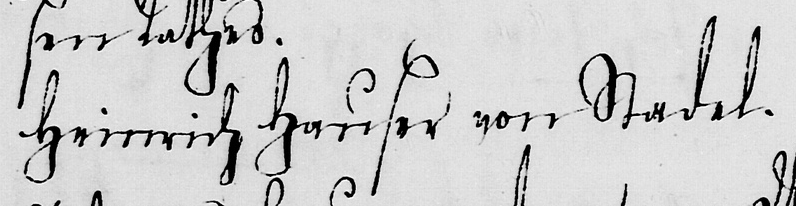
Heinrich Hauser von Stadel.
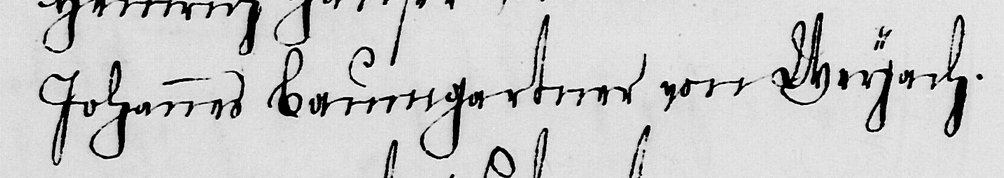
Johannes Baumgartner von Weyach.
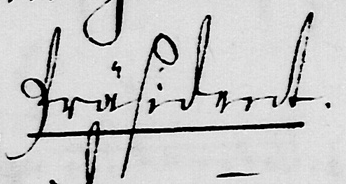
Präsident.
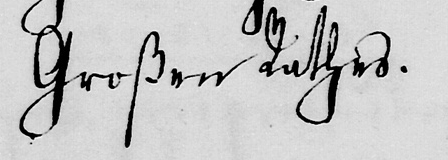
Großen Rathes.
